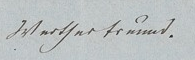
Werther Freund.
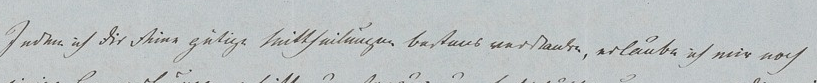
Indem ich Dir deine gütigen Mittheilungen bestens verdanke, erlaube ich mir noch
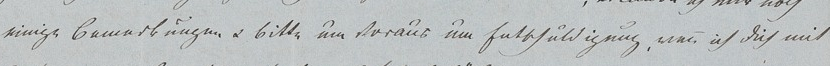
einige Bemerkungen & bitte um Voraus um Entschuldigung, wenn ich Dich mit
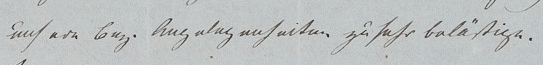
unsern Bez. Angelegenheiten zu sehr belästige.
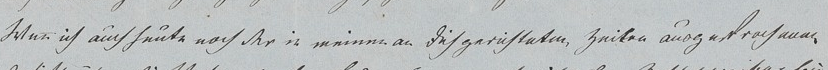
Wenn ich auch heute noch der in meinen an Dich gerichteten Zeilen ausgesprochenen
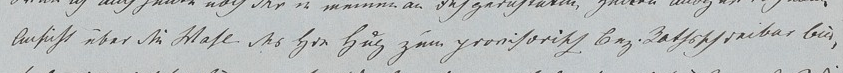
Ansicht über die Wahl des Hrn Hug zum provisorischen Bez.Rathsschreiber bin,
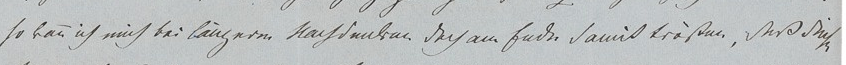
so kann ich mich bei längerm Nachdenken doch am Ende damit trösten, daß diese
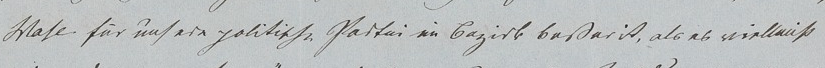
Wahl für unsere politische Partei im Bezirk beßer ist, als es vielleicht
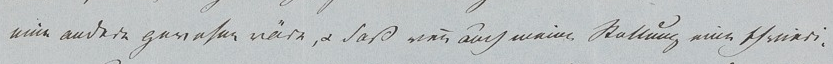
eine andere gewesen wäre, & daß wenn auch meine Stellung eine schwieri-
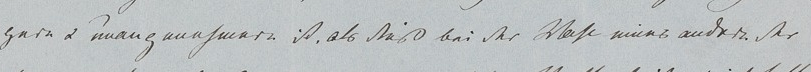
gere & unangenehmere ist, als dieß bei der Wahl eines andern der
